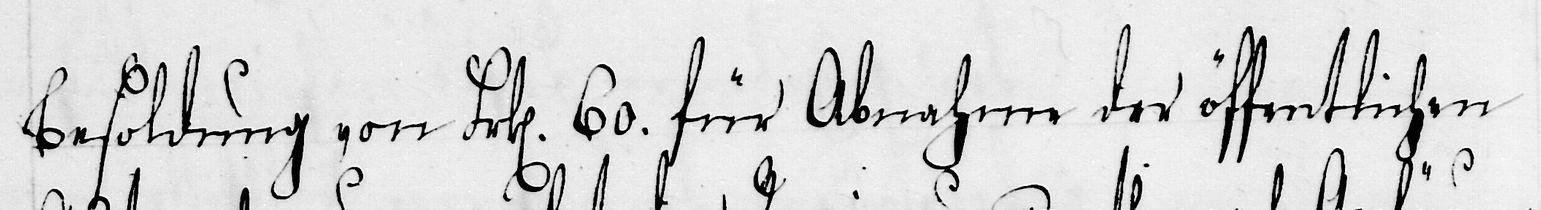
Besoldung von Frk[en]. 60. für Abnahme der öffentlichen
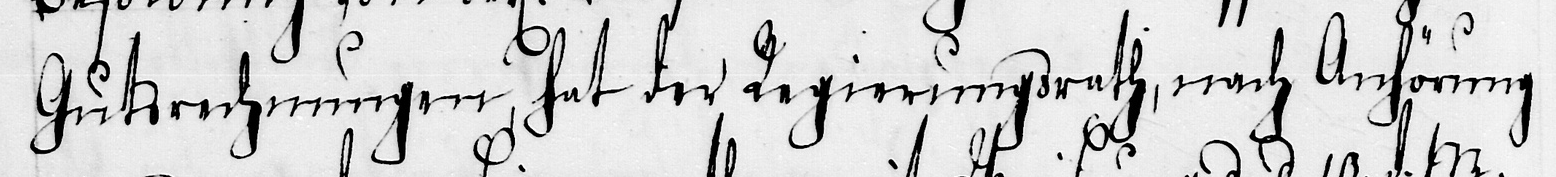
Gutsrechnungen, hat der Regierungsrath, nach Anhörung
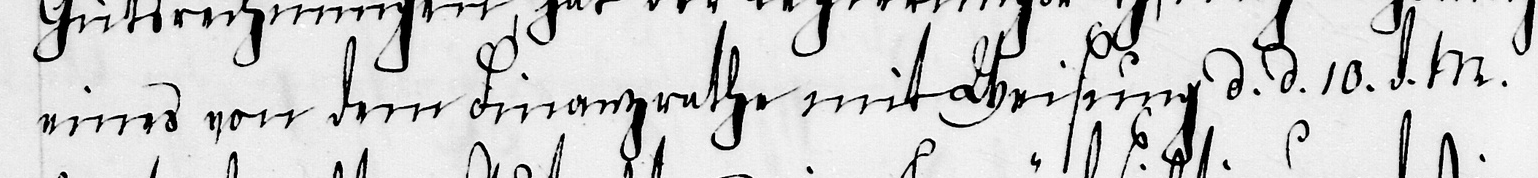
eines von dem Finanzrathe mit Weisung d. d. 10. d. M.
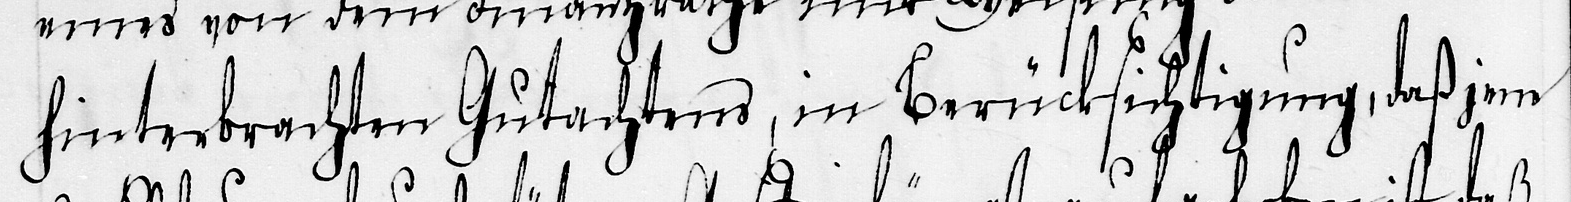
hinterbrachten Gutachtens, in Berücksichtigung, daß jene
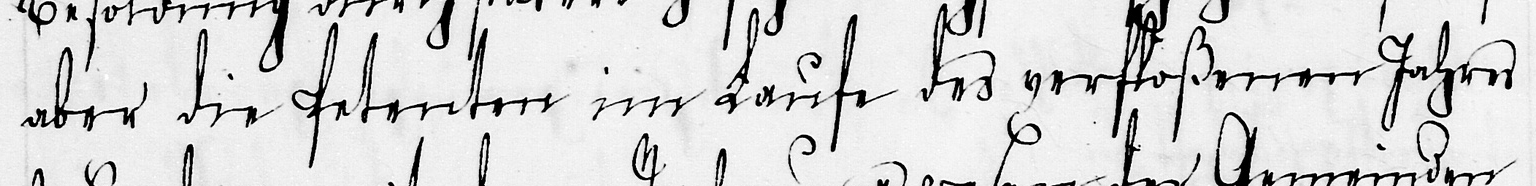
aber die Petenten im Laufe des verfloßenen Jahres
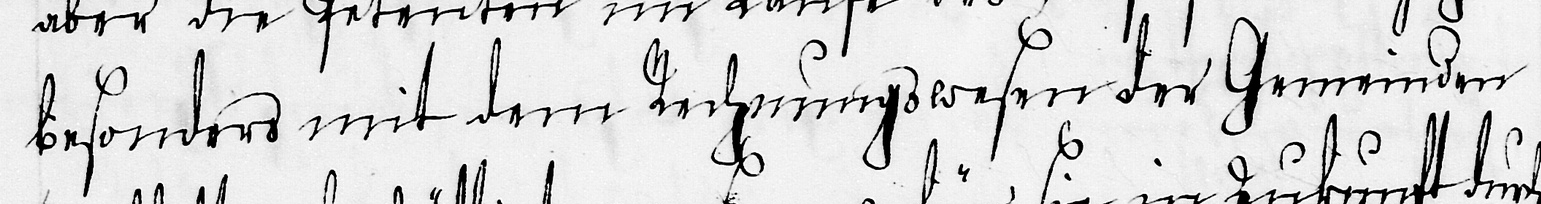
besonders mit dem Rechnungswesen der Gemeinden
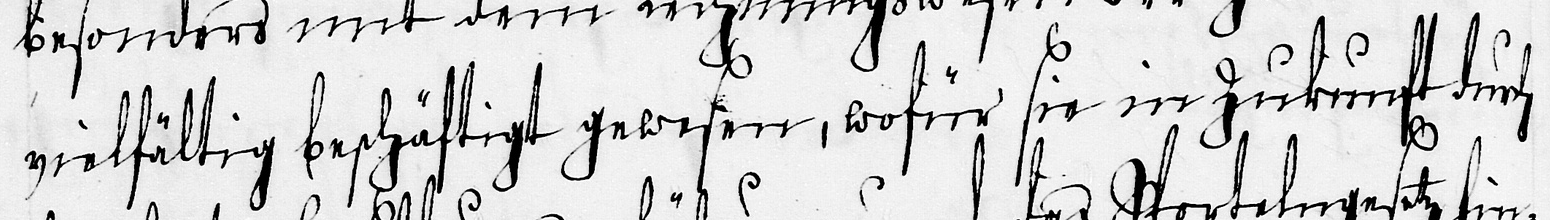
vielfältig beschäftigt gewesen, wofür sie in Zukunft dur¬
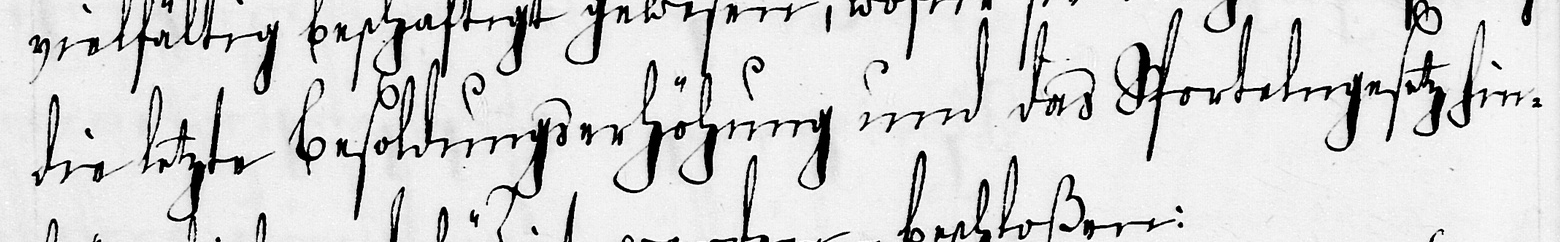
die letzte Besoldungserhöhung und das Sportelngesetz h¬
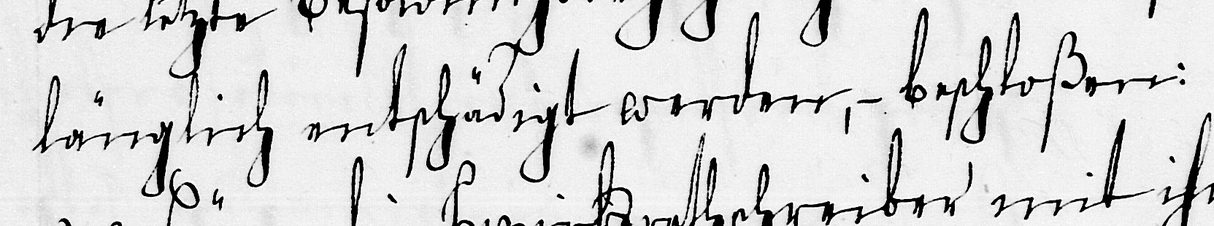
länglich entschädigt werden, – beschloßen:
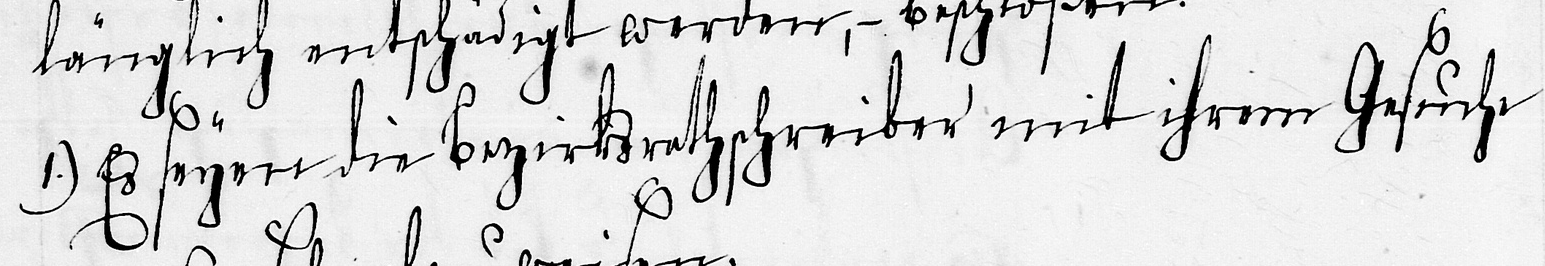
1.) Es seyen die Bezirksrathschreiber mit ihrem Gesuche
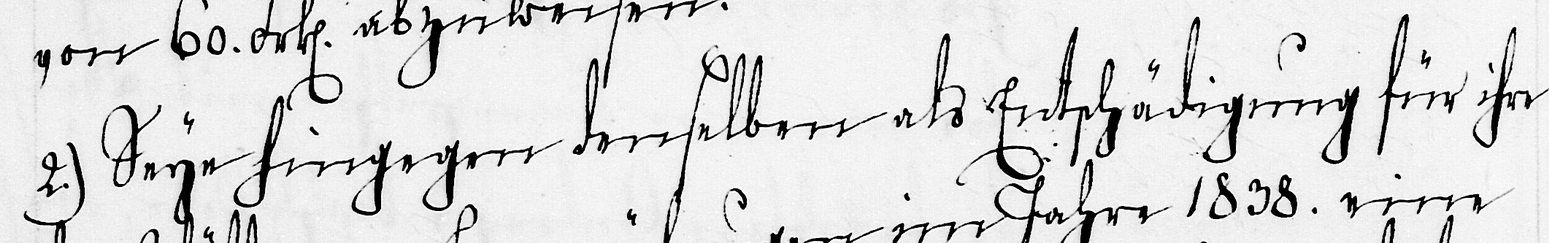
2.) Seye hingegen denselben als Entschädigung für ihre
